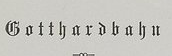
Gotthardbahn.
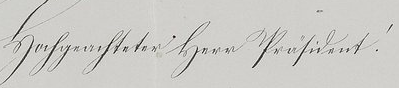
Hochgeachteter Herr Präsident!
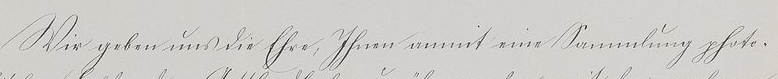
Wir geben uns die Ehre, Ihnen anmit eine Sammlung photo-
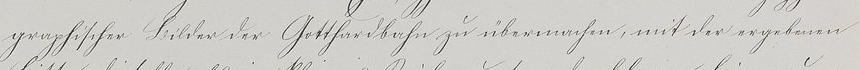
graphischer Bilder der Gotthardbahn zu übermachen, mit der ergebenen
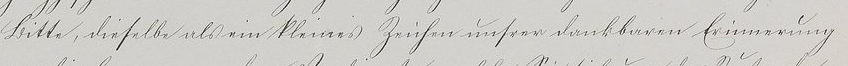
Bitte, dieselbe als ein kleines Zeichen unsrer dankbaren Erinnerung
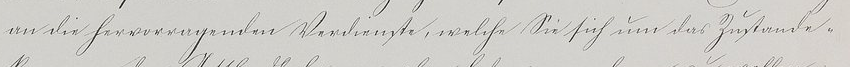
an die hervorragenden Verdienste, welche Sie sich um das Zustande-
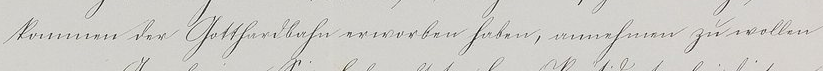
kommen der Gotthardbahn erworben haben, annehmen zu wollen.
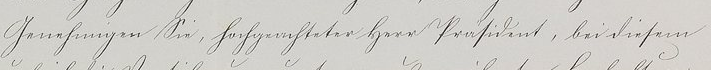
Genehmigen Sie, hochgeachteter Herr Präsident, bei diesem
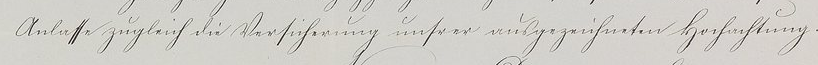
Anlasse zugleich die Versicherung unsrer ausgezeichneten Hochachtung.
